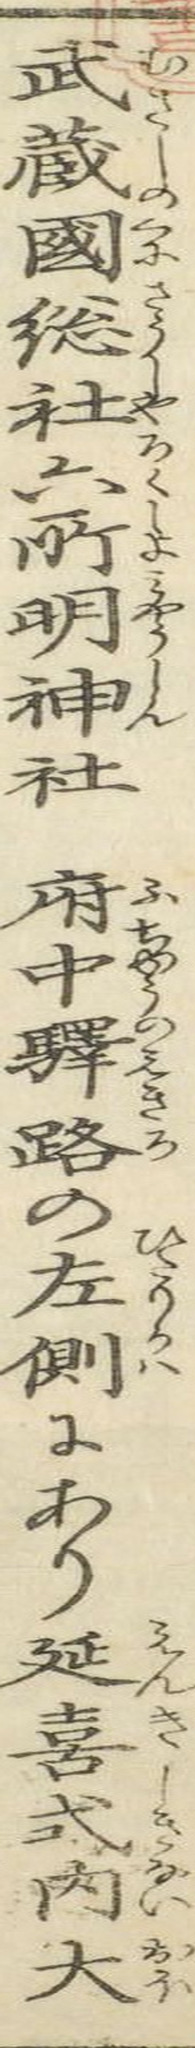武蔵野国総社六所明神社府中駅路の左側にあり延喜式内大
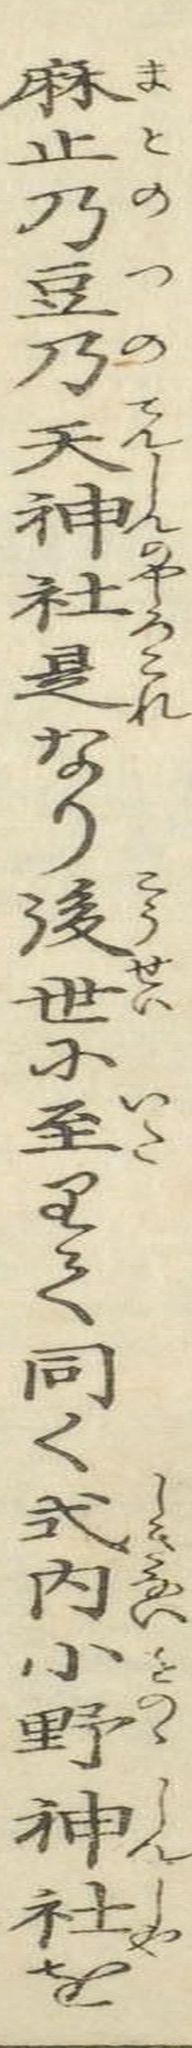麻止乃豆乃天神社是なり後世に至りて同く式内小野神社を
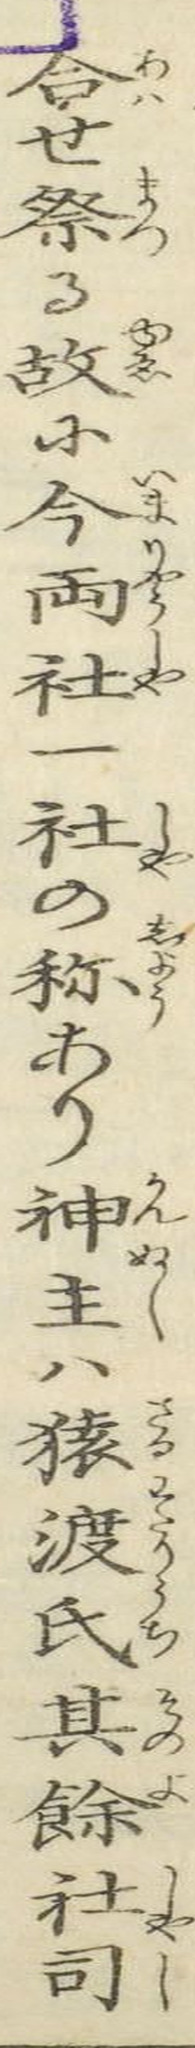合せ祭る故に今両社一社の称あり神主は猿渡氏其余社司
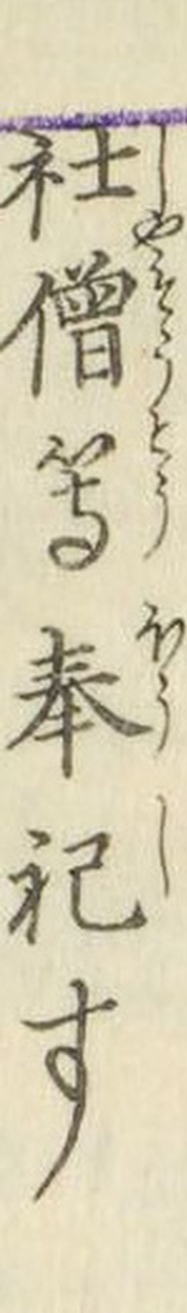社僧等奉祀す
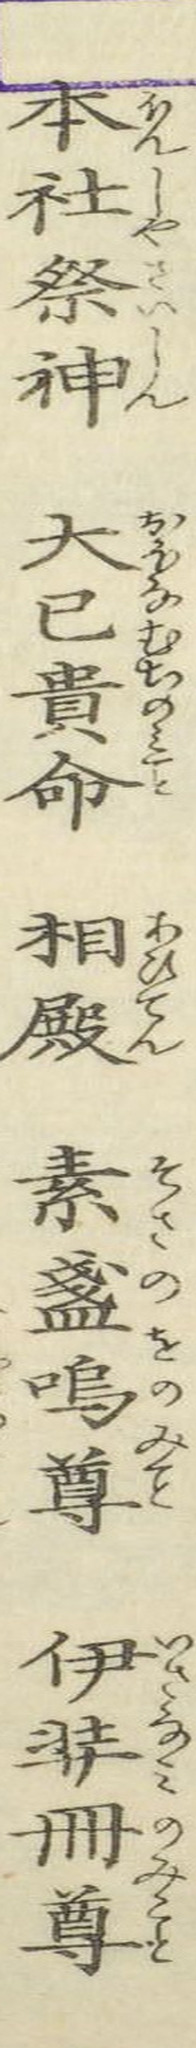本社祭神大已貴命相殿素盞嗚尊伊弉冊尊
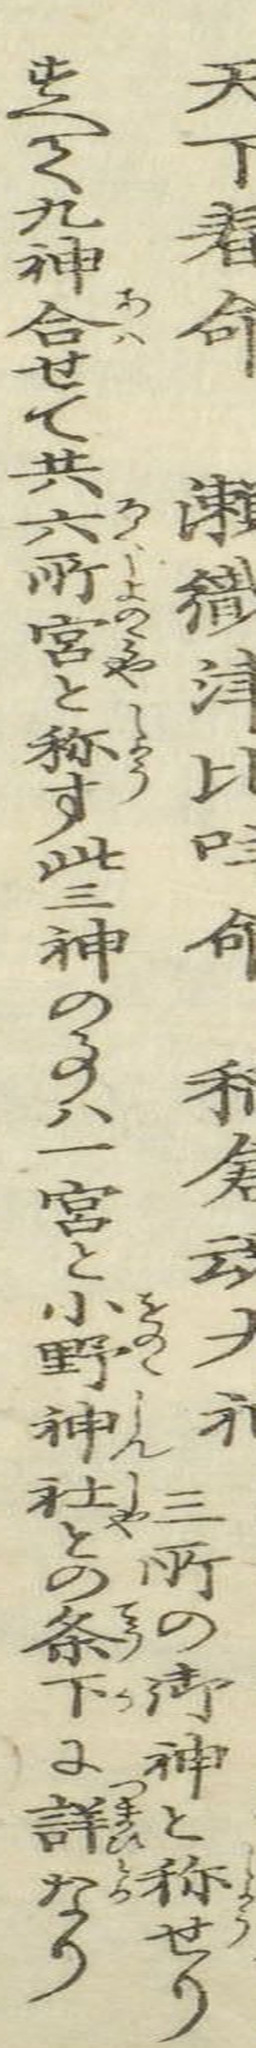すへて九神合せて共六所宮と称す此三神の事は一宮と小野神社との条下に詳なり
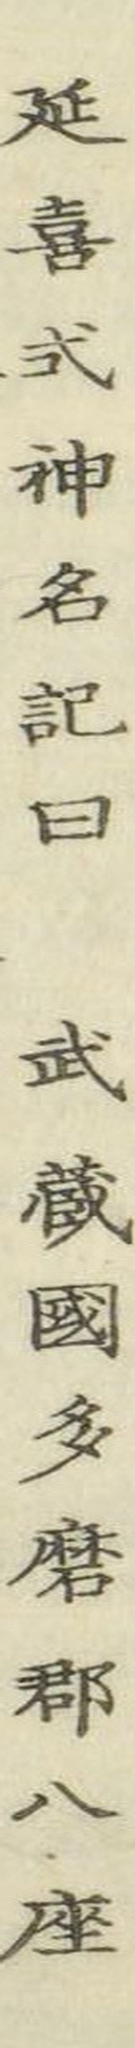延喜式神名記曰武蔵国多磨郡八座
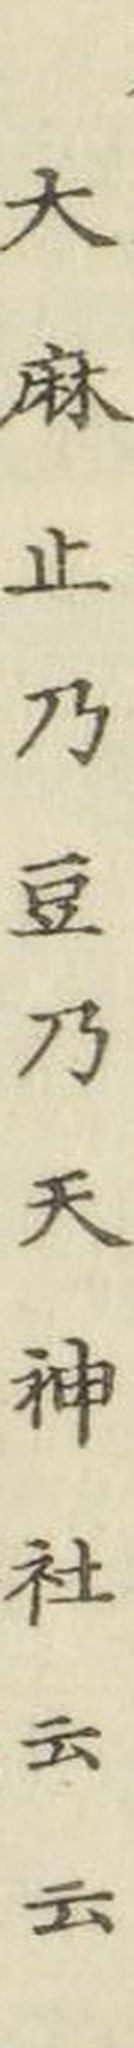大麻止乃豆乃天神社云々
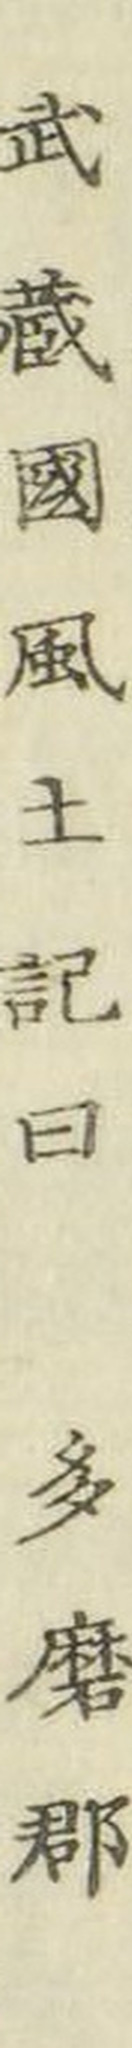武蔵国風土記曰多摩郡
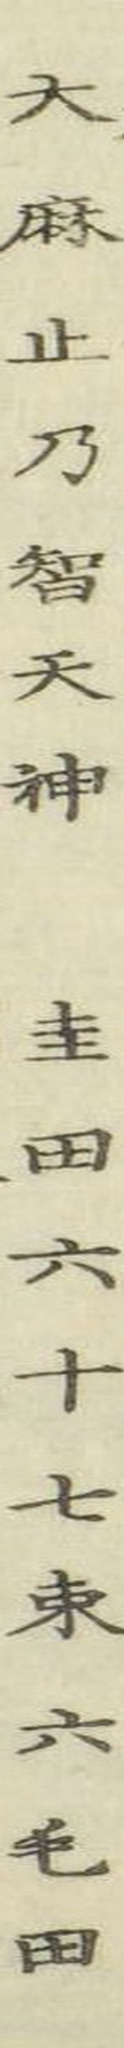大麻止乃智天神圭田六十七束六毛田
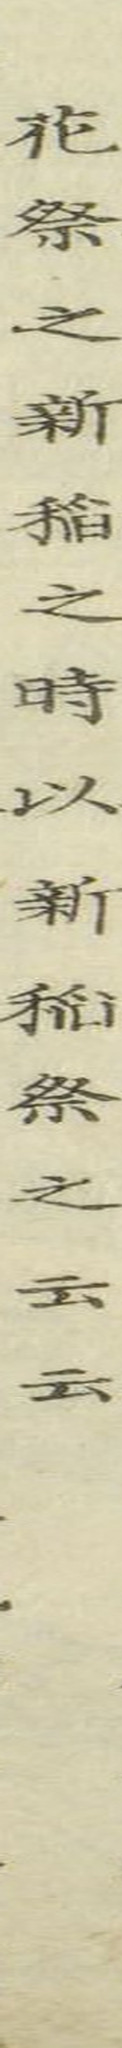花祭之新稲之時以新稲祭之云云
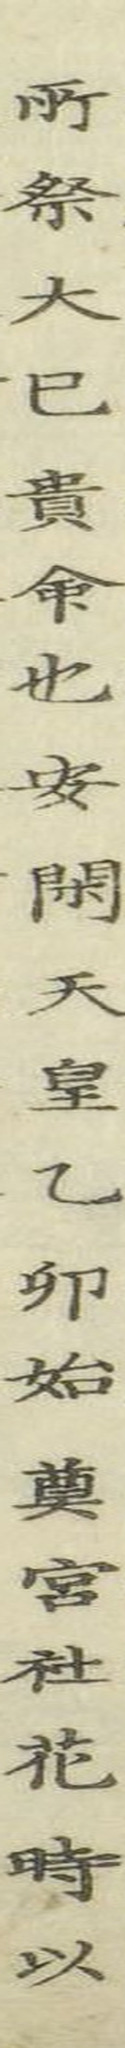所祭大巳貴命也安閑天皇乙卯始奠宮社花時以
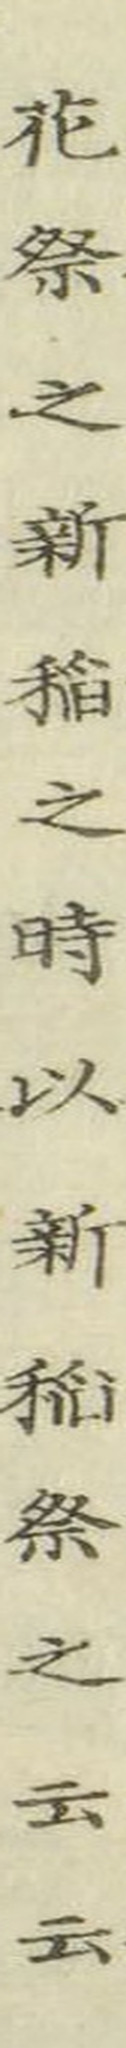花祭之新稲之時以新稲祭之云云
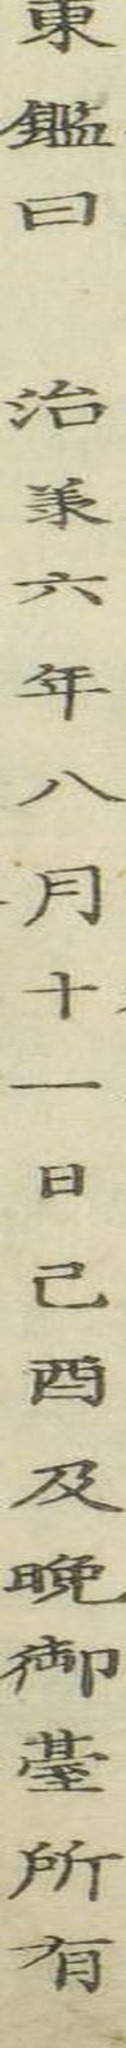東鑑曰治承六年八月十一日己酉及晩御台所有
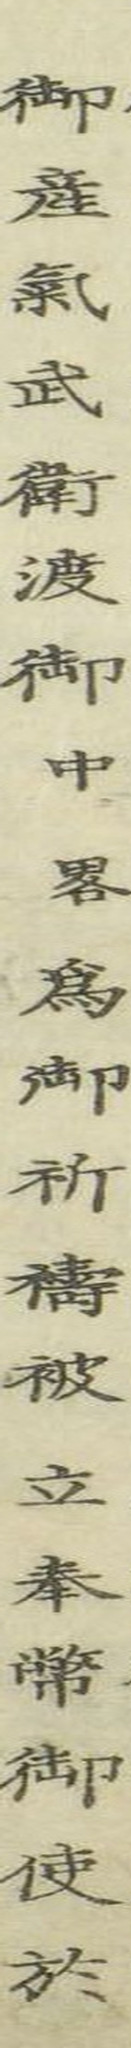御産気武衛渡御中略為御祈祷被立奉幣御使於
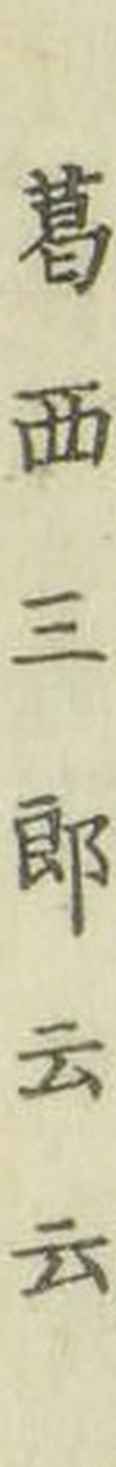葛西三郎云云
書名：江戸名所図会 20巻 巻之10
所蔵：東京学芸大学教育コンテンツアーカイブ
